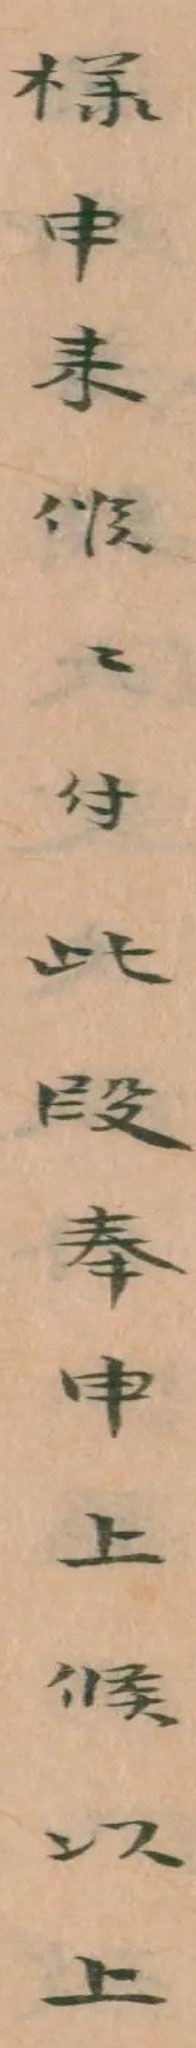様申来候二付此段奉申上候以上
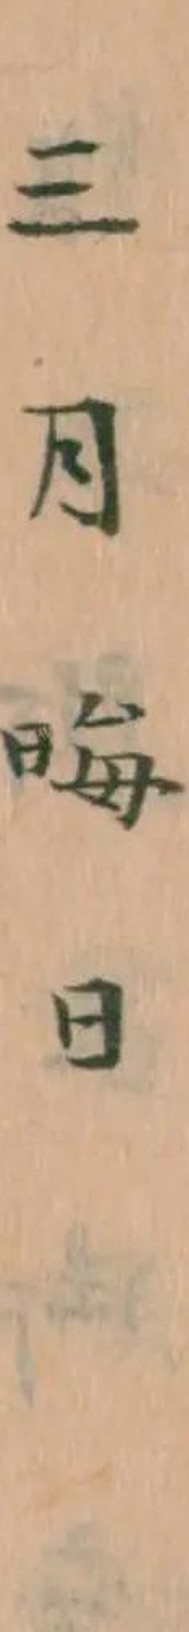三月晦日
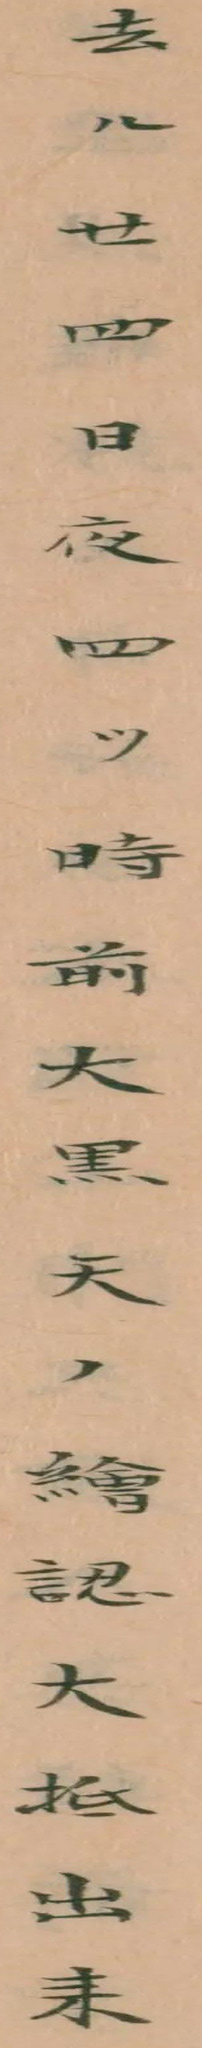去ㇽ廿四日夜四ッ時前大黒天ノ絵認大抵出来
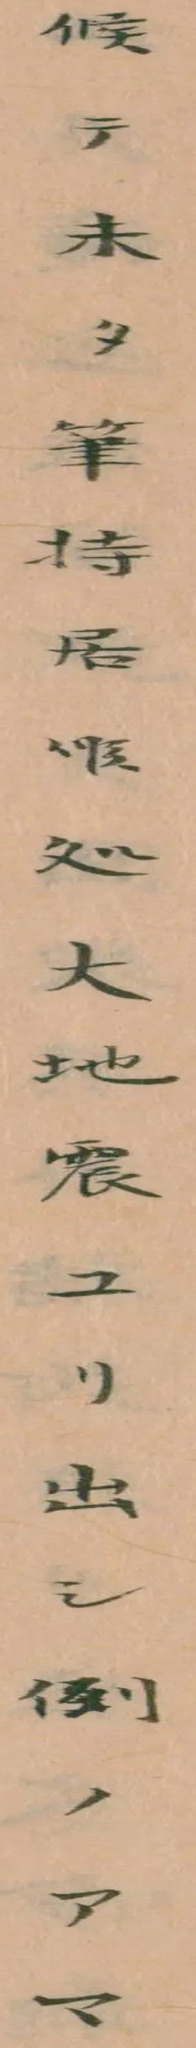候テ未タ筆持居候処大地震ユリ出シ側ノアマ
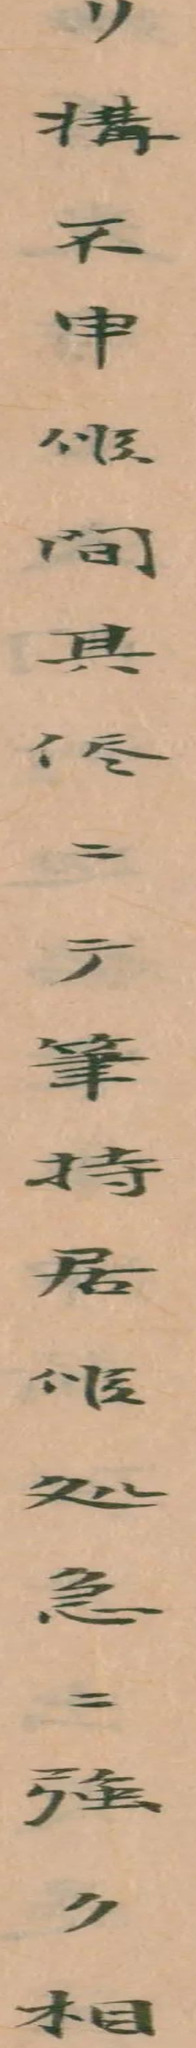り構不申候間其侭ニテ筆持居候処急二強ク相
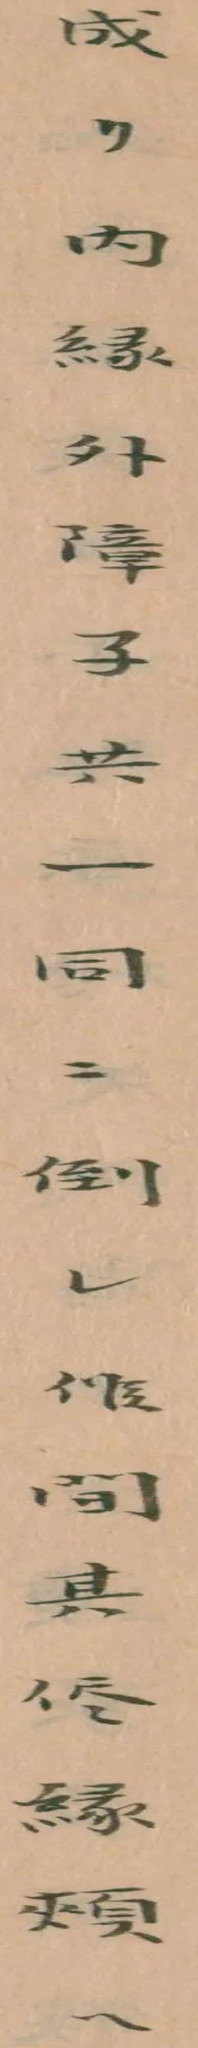成り内縁外障子共一同二倒レ候間其侭縁頬へ
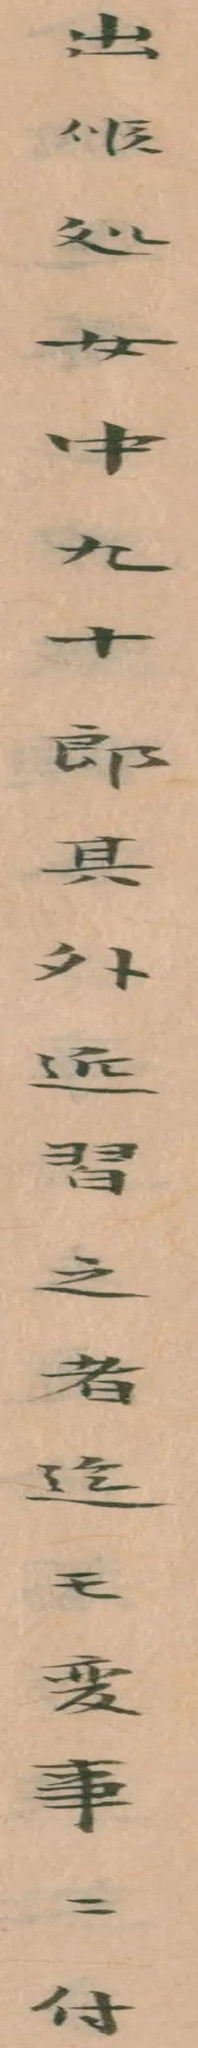出候処女中九十郎其外近習之者迄モ変事二付
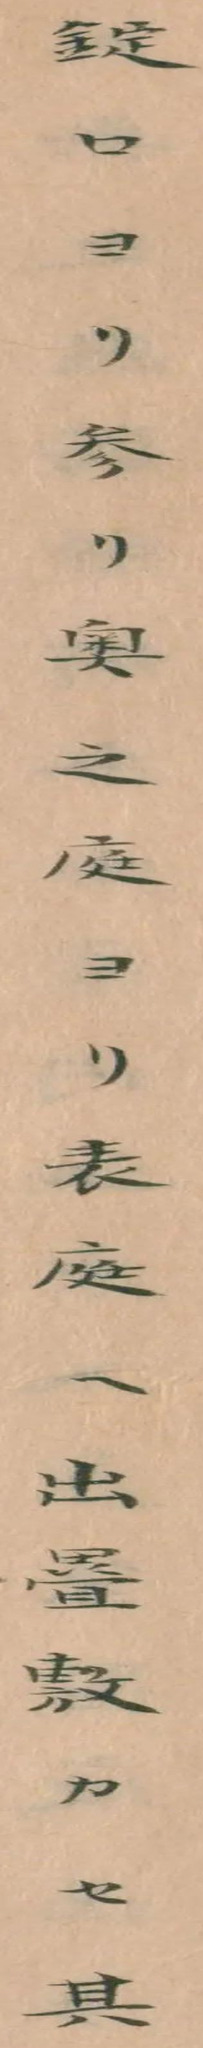錠口ヨリ参り奥之庭ヨリ表庭へ出畳敷カセ其
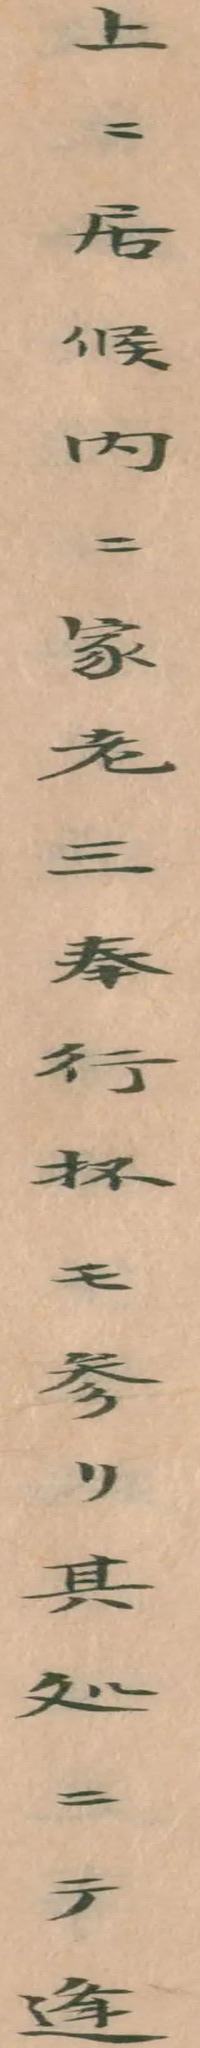上二居候内二家老三奉行抔モ参り其処ニテ逢
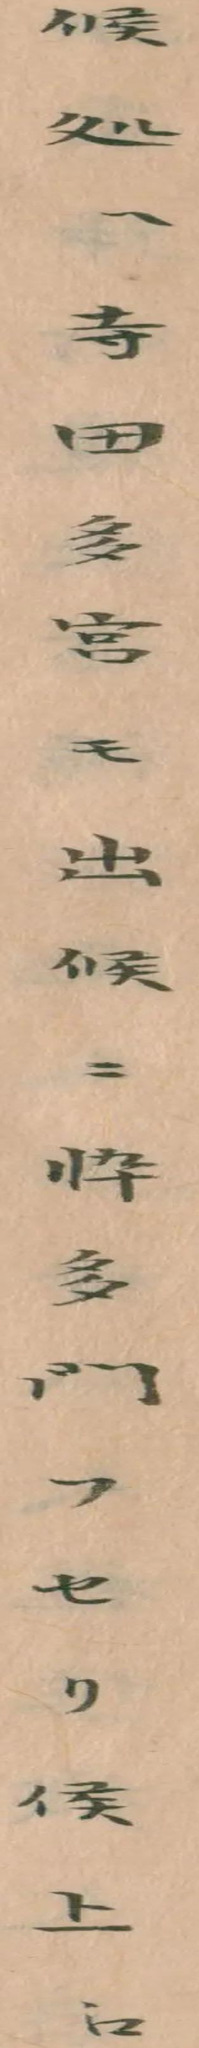候処へ寺田多宮モ出候二伜多門フセリ候上江
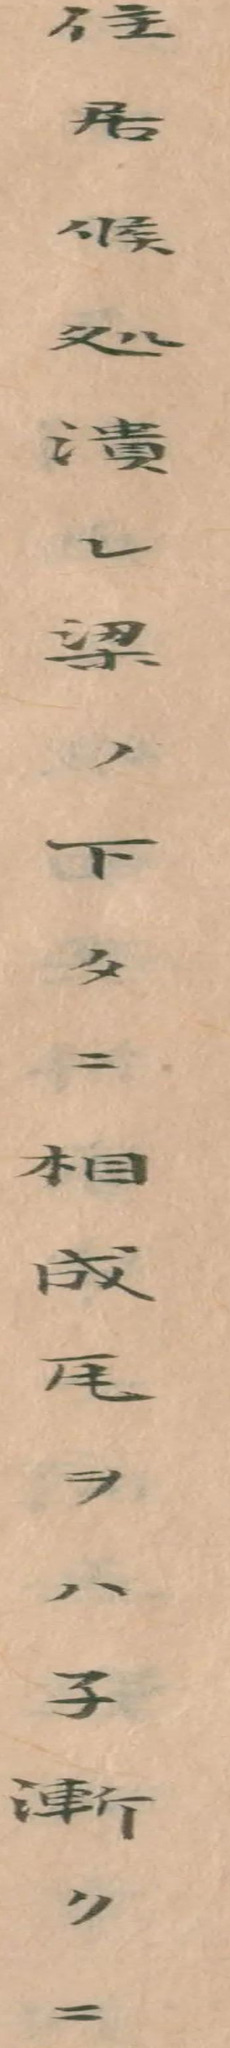住居候処潰レ梁ノ下タ二相成瓦ヲハ子漸〃二
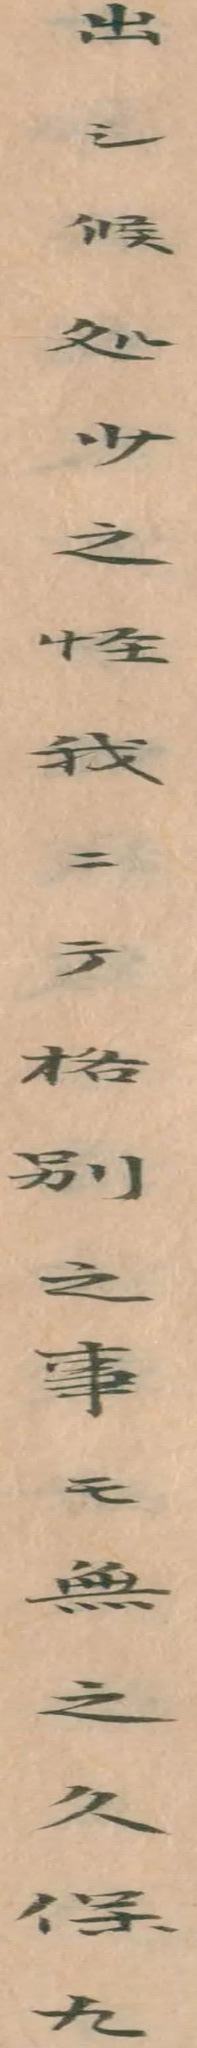出シ候処少之怪我ニテ格別之事モ無之久保九

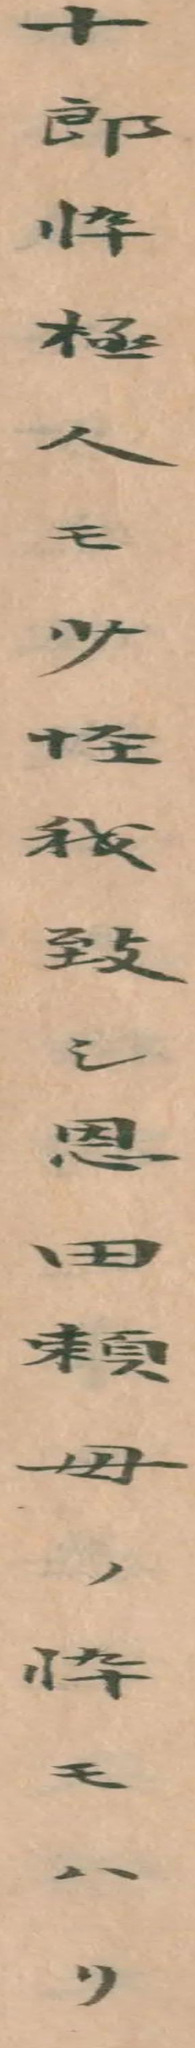十郎伜極人モ少怪我致シ恩田頼母ノ伜モハリ
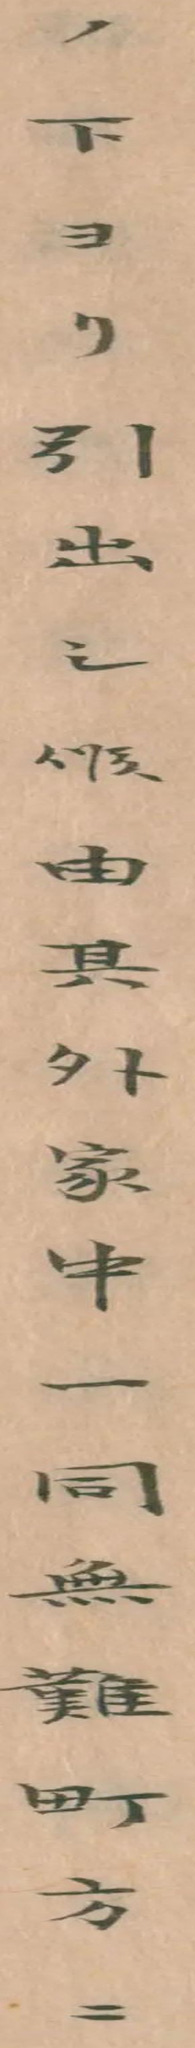ノ下ヨリ引出シ候由其外家中一同無難町方二
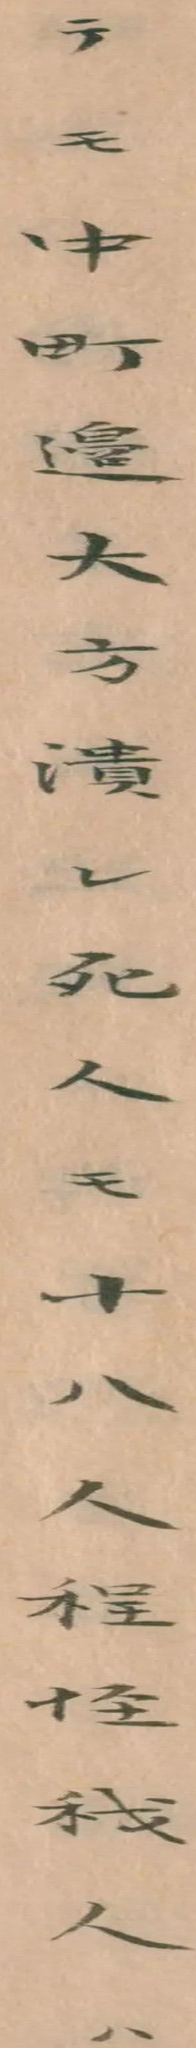テモ中町辺大方潰レ死人モ十八人程怪我人ハ
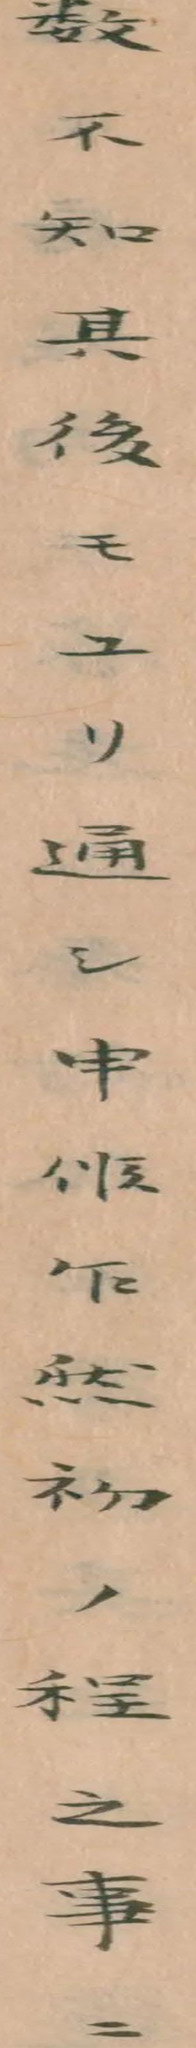数不知其後モユリ通シ申候乍然初ノ程之事二
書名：地災撮要. 巻1(噴火山・地震ノ部)
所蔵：国立国会図書館 National Diet Library, JAPAN
